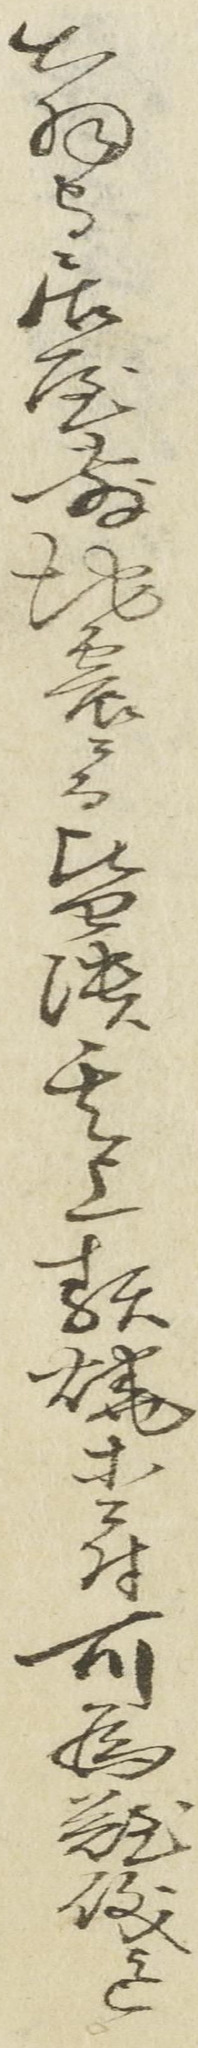出羽守居屋敷地震ニ而皆潰其上類焼等ニ付可為難儀と被
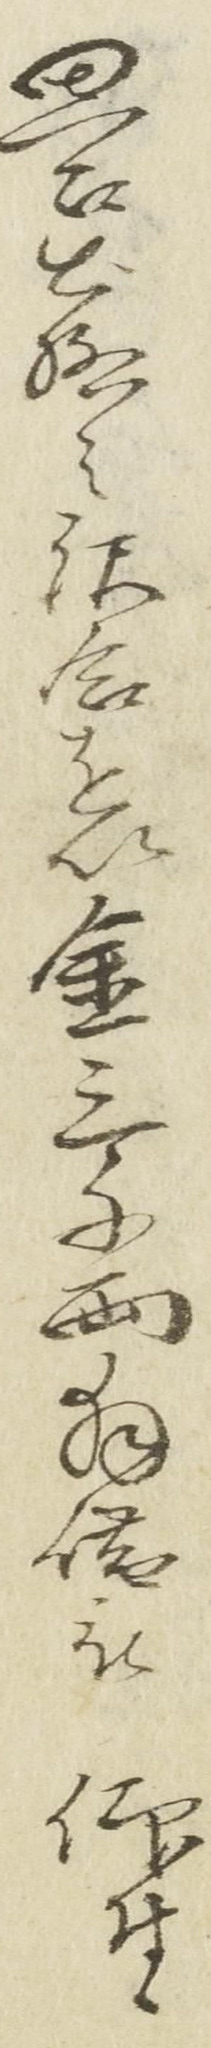思召出格之訳合を以金三千両拝借被仰付候
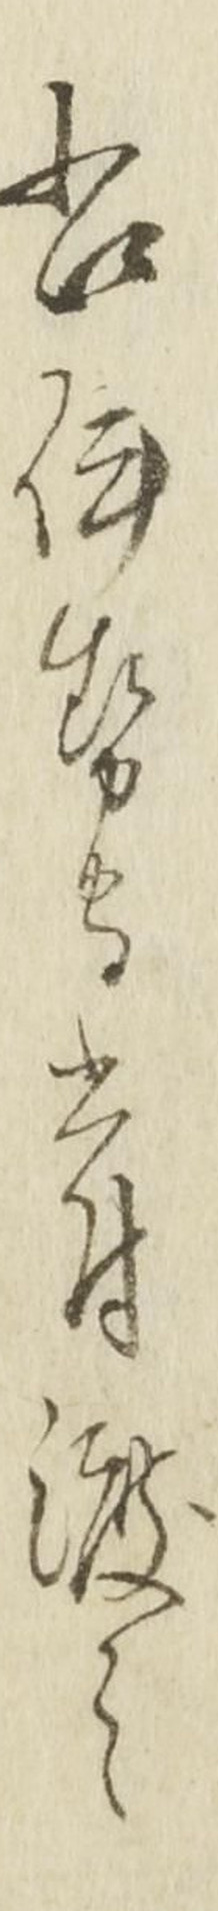右伊勢守書付渡之
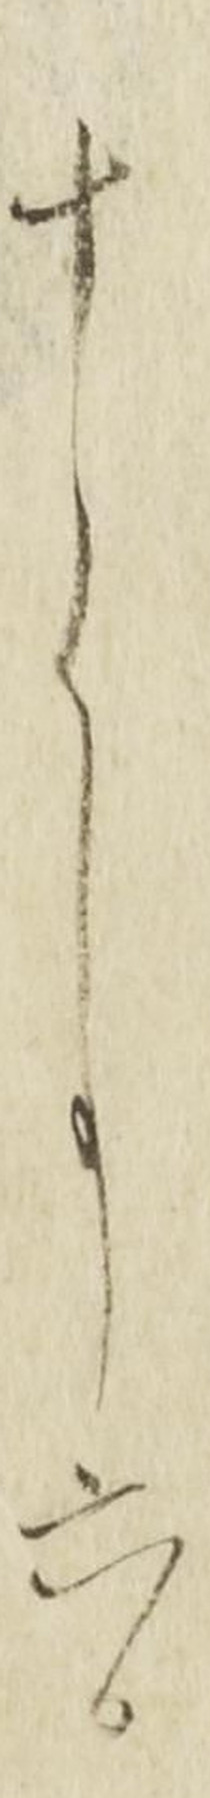十月六日
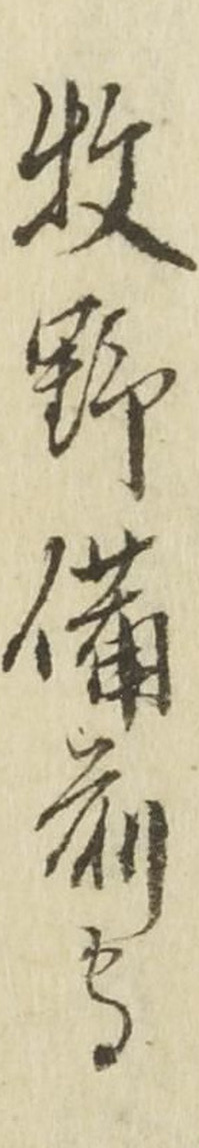牧野備前守
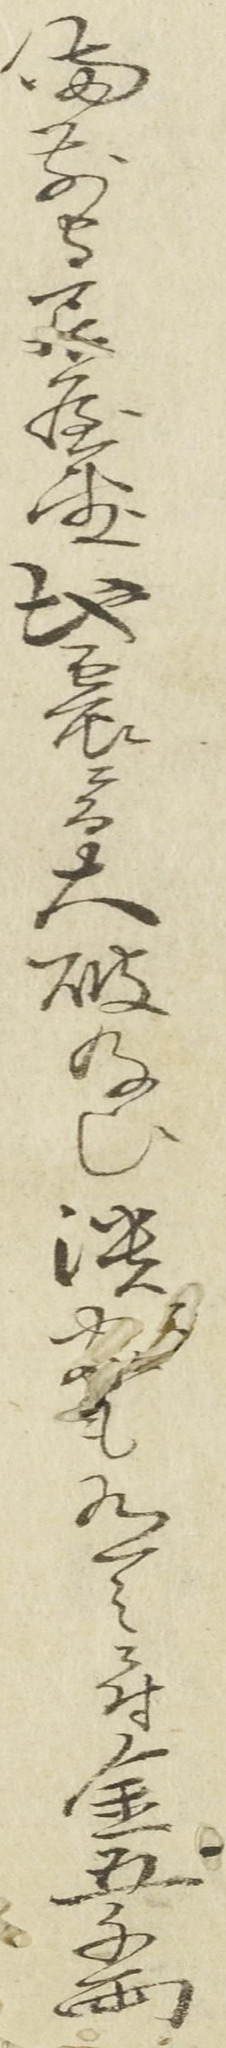備前守居屋敷地震ニ而大破及び潰家も有之ニ付金五千両
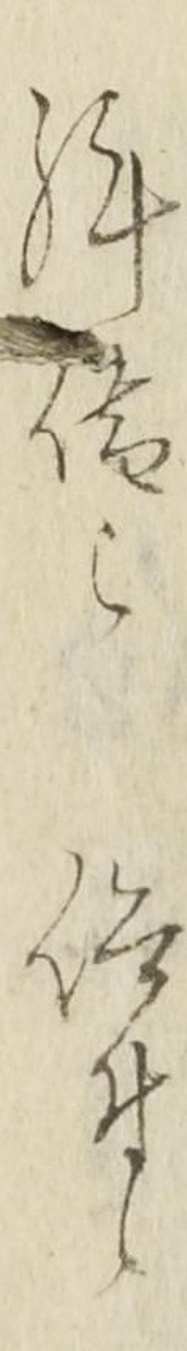拝借被仰付候
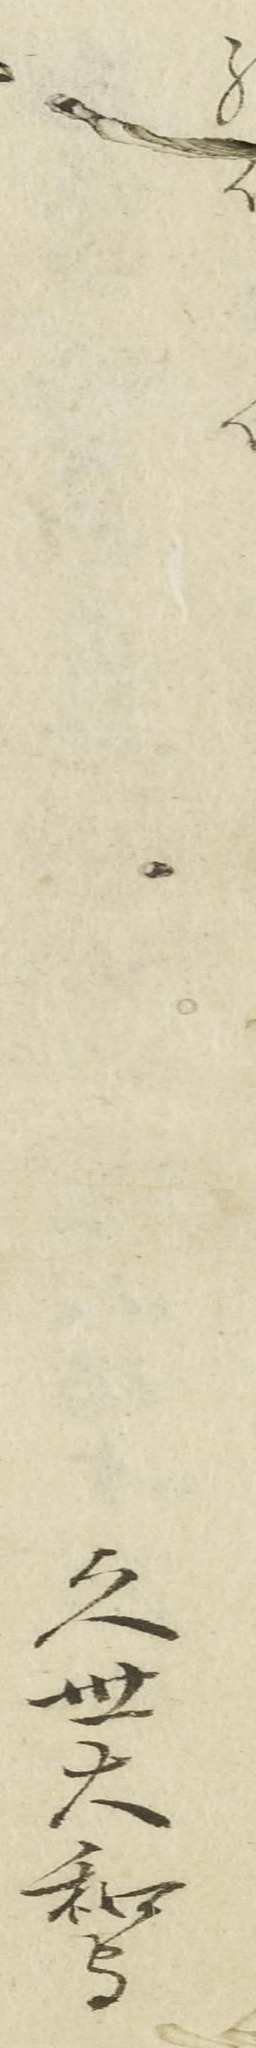久世大和守
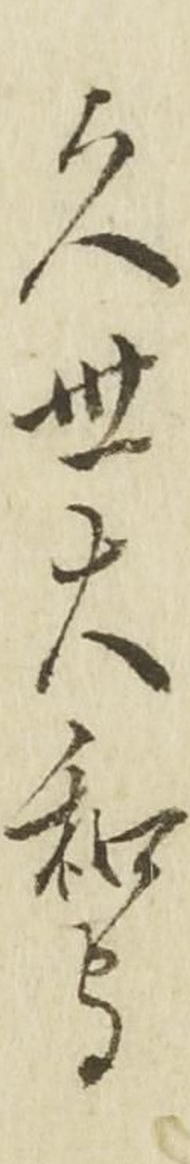久世大和守
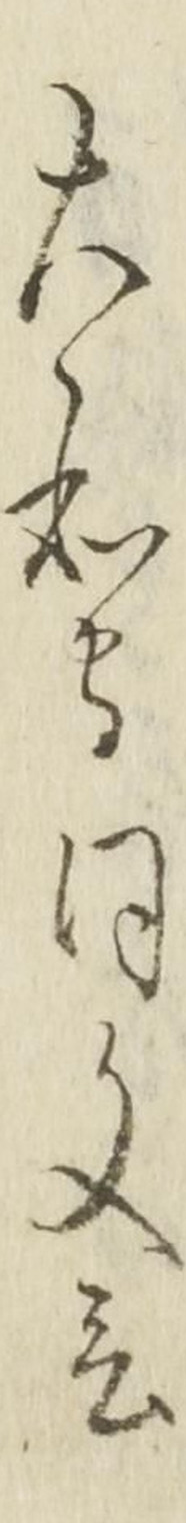大和守同文言
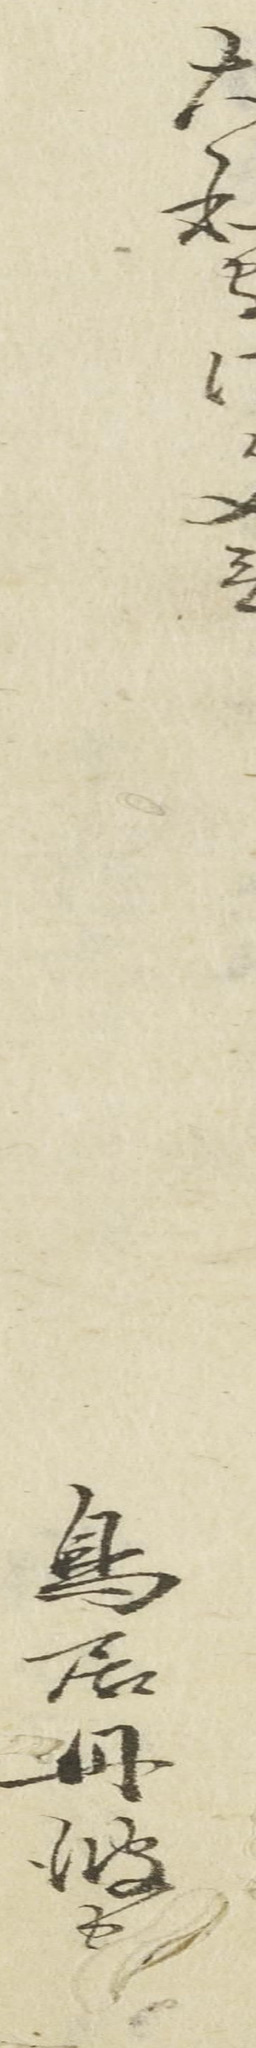鳥居丹波守
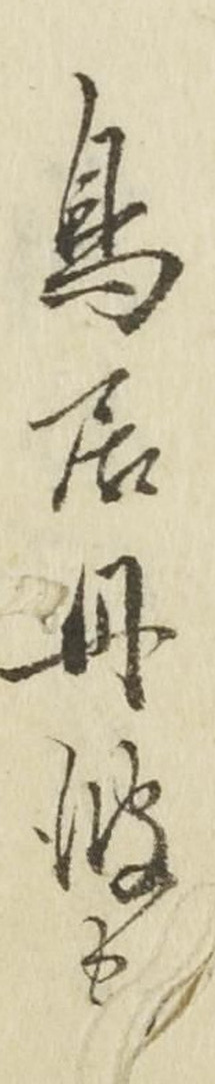鳥居丹波守
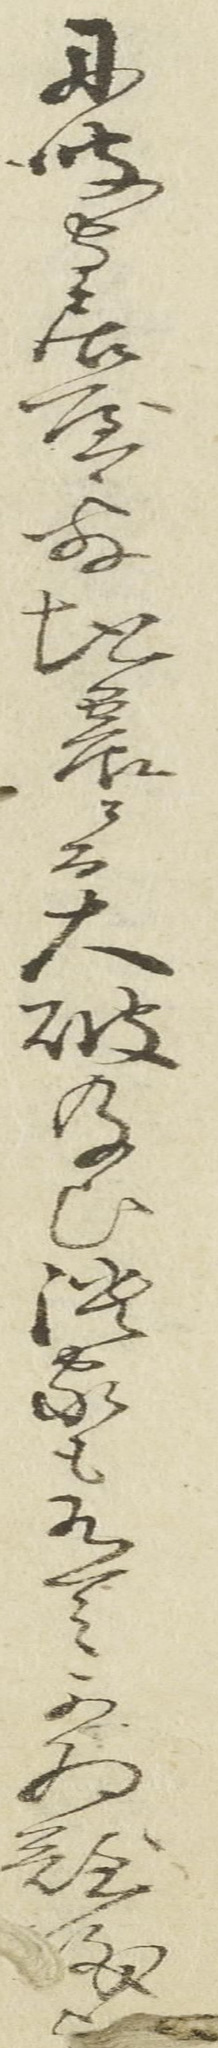丹波守居屋敷地震ニ而大破及び潰家も有之可為難儀
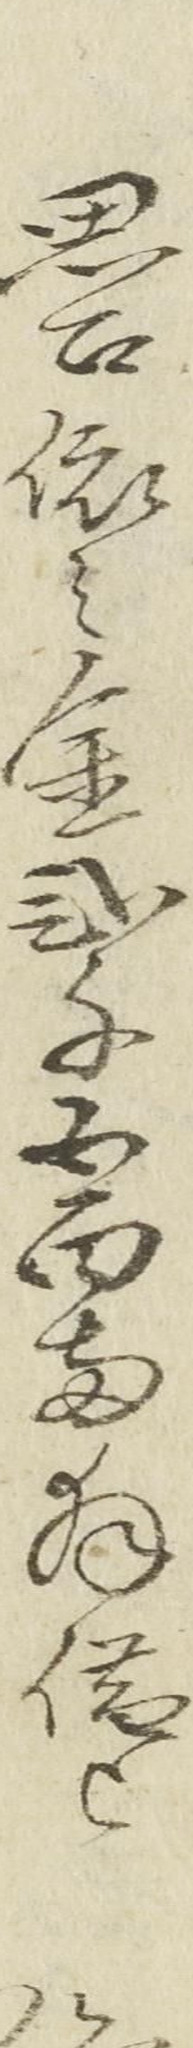被思召依之金二千五百両拝借被仰付候
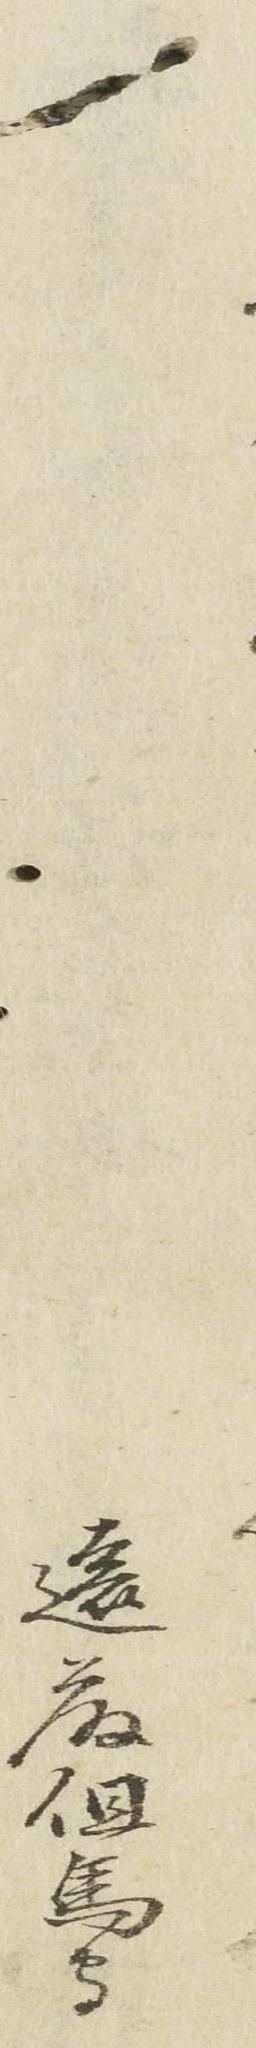遠藤但馬守
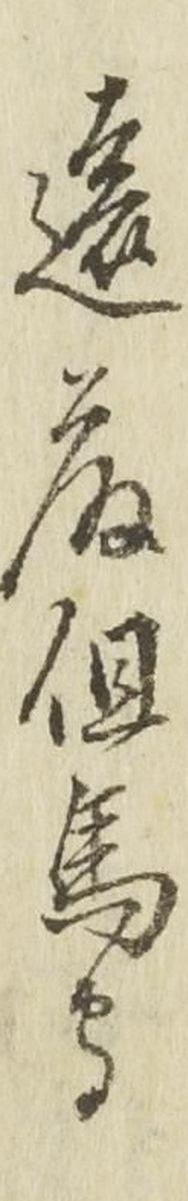遠藤但馬守
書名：安政二乙卯年十月二日大地震之事
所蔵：東京大学地震研究所図書室 Earthquake Research Institute Library, The University of Tokyo, JAPAN
